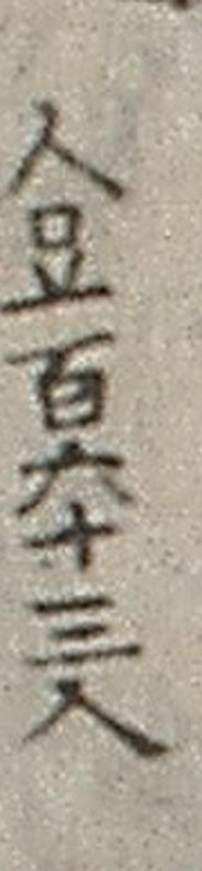人足三百三十三人
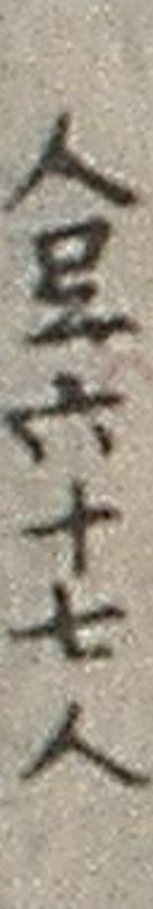人足百十七人
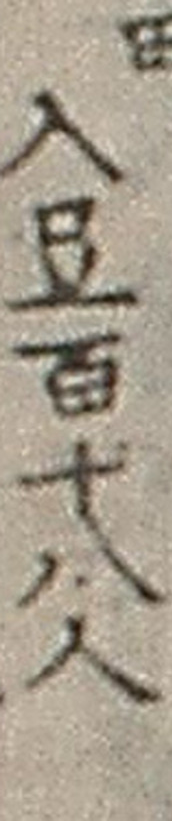人足四十八人
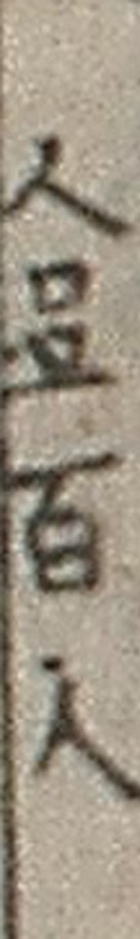人足百人
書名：嘉永三戌年二月五日　焼場方角案内記
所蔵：東京大学地震研究所図書室 Earthquake Research Institute Library, The University of Tokyo, JAPAN
